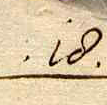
i8.
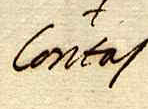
Contas
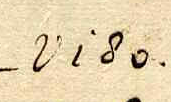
$i80.
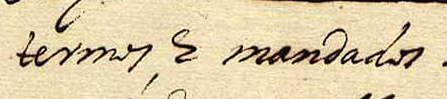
termos, E mandados
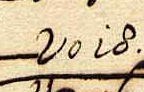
$0i8.
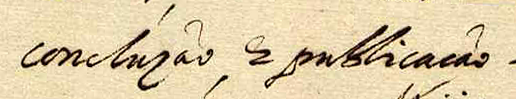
concluzaõ, E publicação
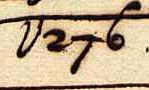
$276.
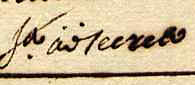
sa. ao secreto
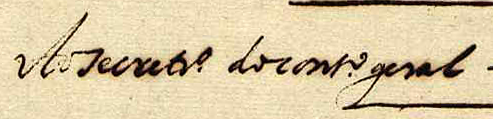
Ao secretr.o do cons.o geral
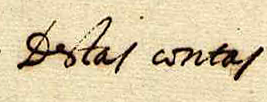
Destas contas
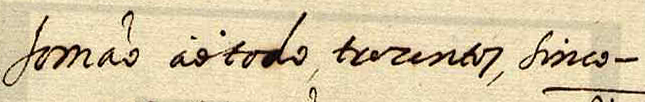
somão ao todo, trezentos, sinco
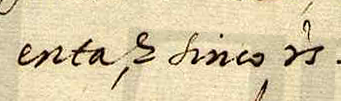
enta, E sinco rs̄
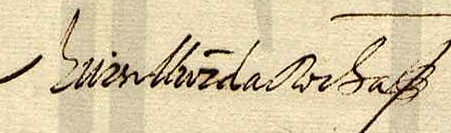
Luis Aluz̄ da Rocha
